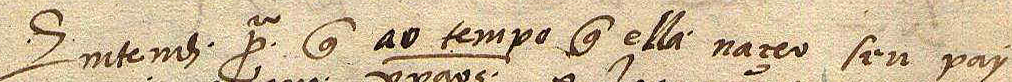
Emtemdj ꝓ̄ q̄ ao tempo q̄ ella naceo seu pay
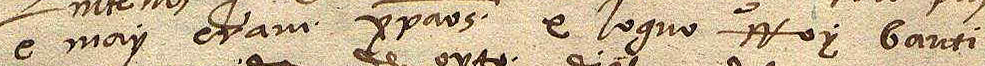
e may eram xpãos. e loguo ffoy bauti
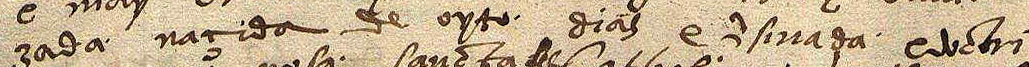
zada na cidade oyto dias e ēsinada. e doctri
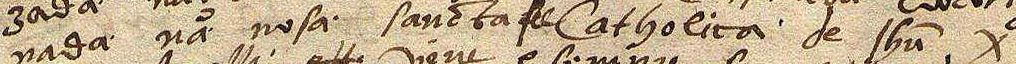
nada na nosa sancta fe Catholica de Jhū Xo
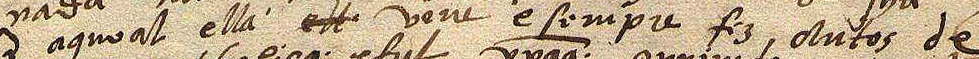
ē a quoal ell veue e sempre fez Autos de
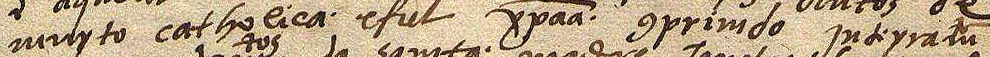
muyto catholica. e fiel xpāa ꝯprimdo jnteyramte
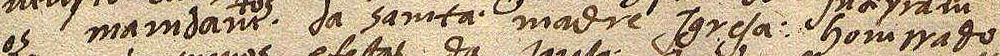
os mandamtos. da samta madre Jgreja: homrrado
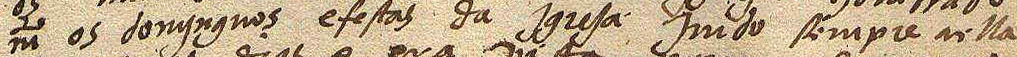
mto os domjnguos e festas da Jgreja. Jmdo sempre a ella
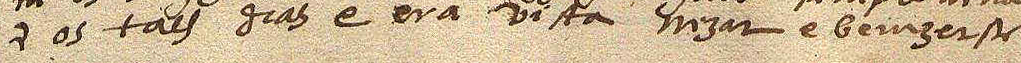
ē os taes dias e era vista rrezar e bemzerse
